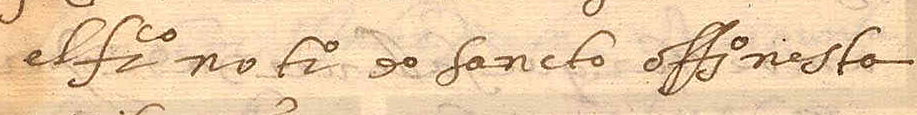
el frco notro do sancto offjo nesta
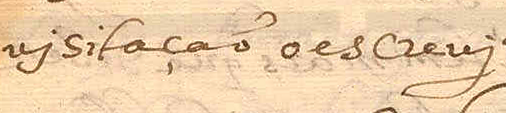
ujsitaçaõ o escreuj
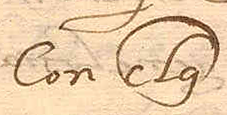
Conc̄lꝯ
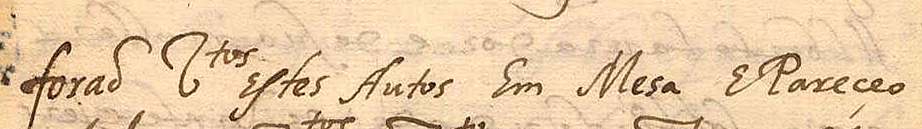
foraõ Vtos Estes Autos Em Mesa E Pareceo
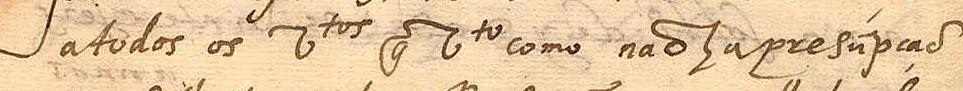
a todos os Vtos q̄ Vto como naõ ha presūpçaõ
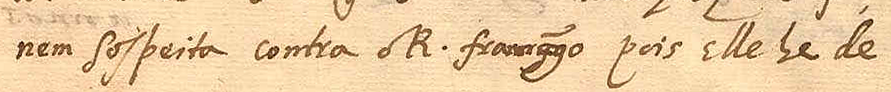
nem sospeita contra o R. framēgo pois Elle he de
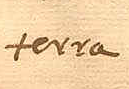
terra
